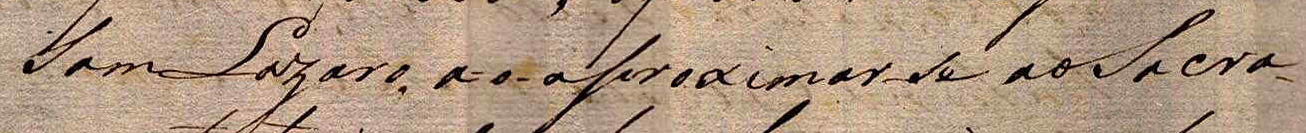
Sam Lazaro, a-o- aproximar-se ao Sacra
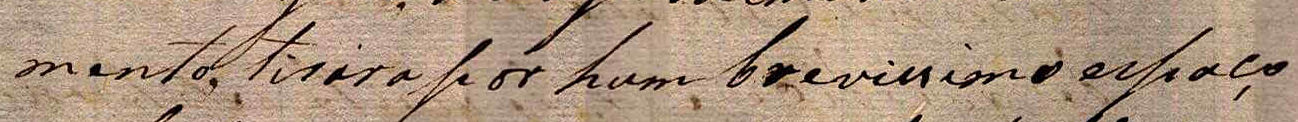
mento, tirara por hum brevissimo espaço
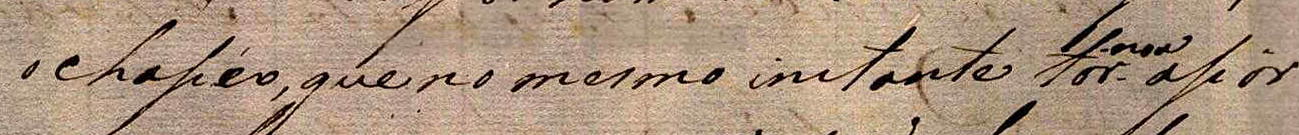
o chapéo, que no mesmo instante tor.nou a pôr
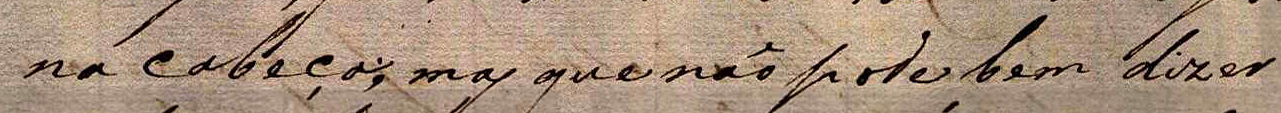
na cabeça; mas que naõ pode bem dizer
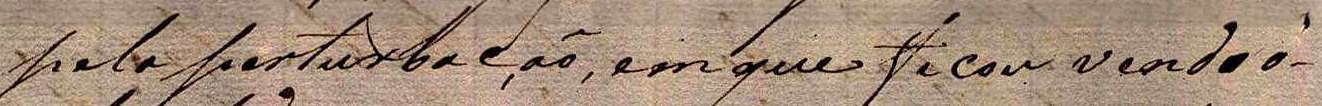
pela perturbaçaõ, em que ficou vendo o
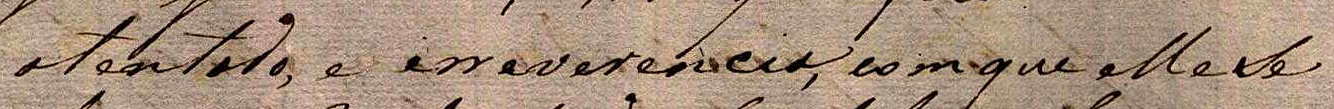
atentado, e irreverencia, com que elle Se
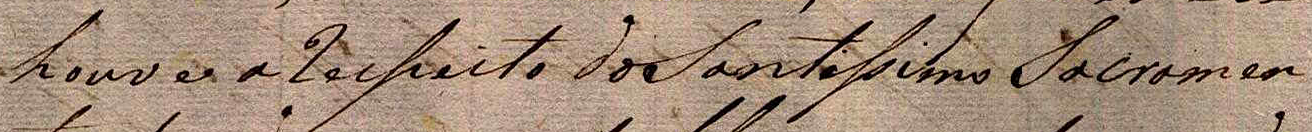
houve a Respeito do Santissimo Sacramen
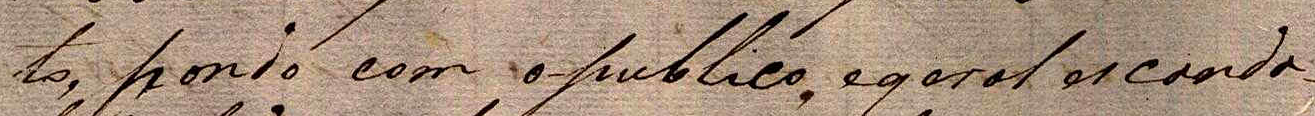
to, pondo com o publico, e geral escanda
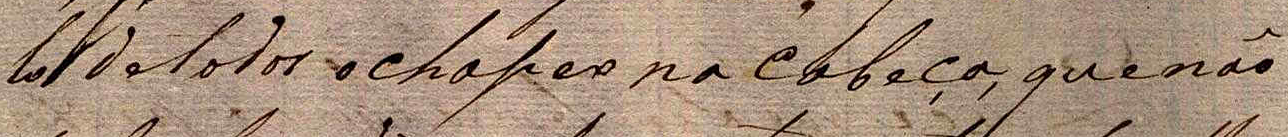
lo de todos o chapeo na cabeça, que naõ
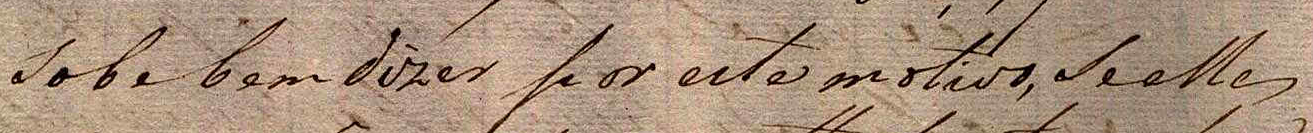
sobe bem dizer por este motivo, se elle
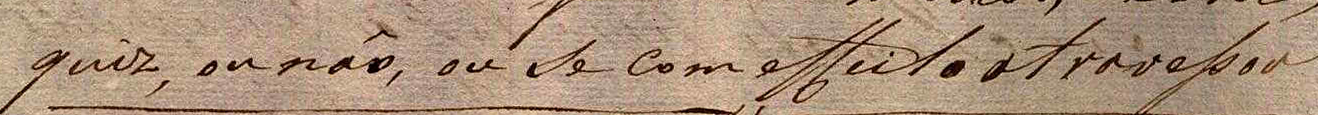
quiz, ou naõ, ou se com effeito atravessou
